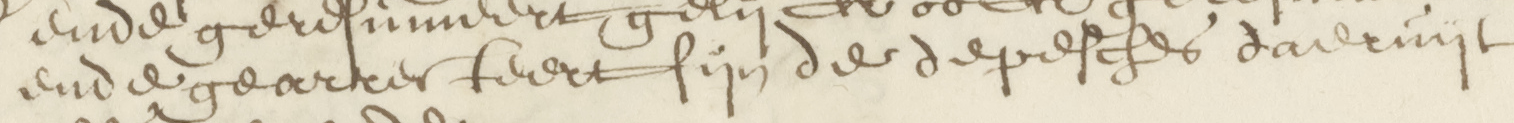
ende gearresteert sijn de depesches daeruijt
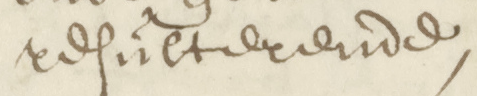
resulterende.
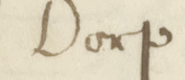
Dorp
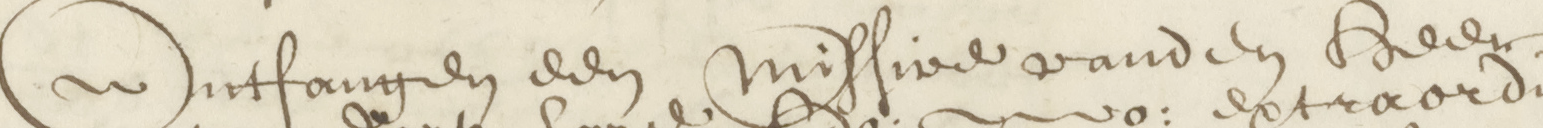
Ontfangen een missive vanden Heer
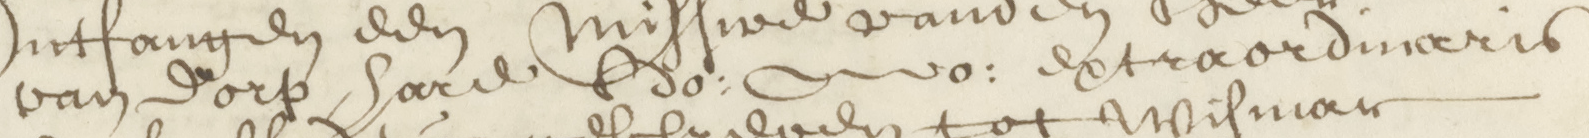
van Dorp, hare Ho:Mo: extraordinaris
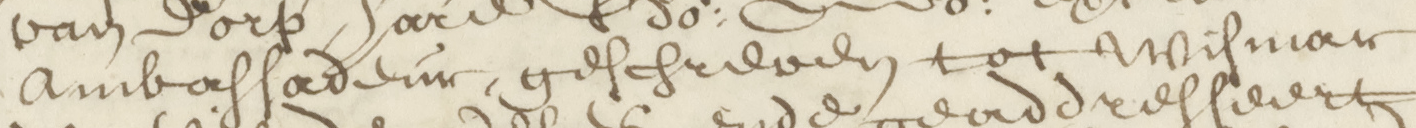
Ambassadeur, geschreven tot Wismar
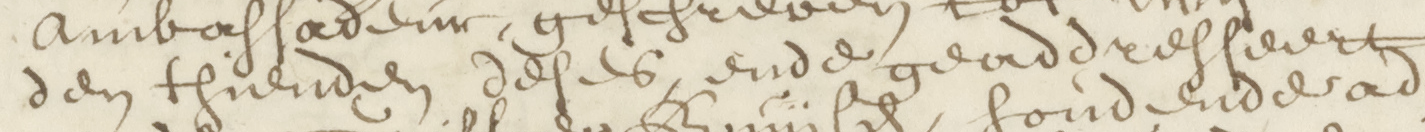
den thienden deses, ende geaddresseert
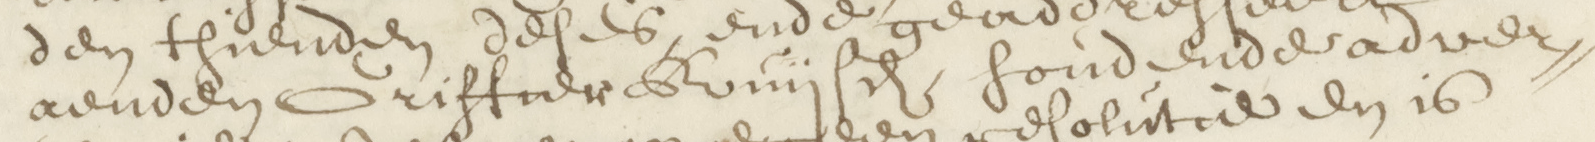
aenden Griffier Ruijsch houdende adver„
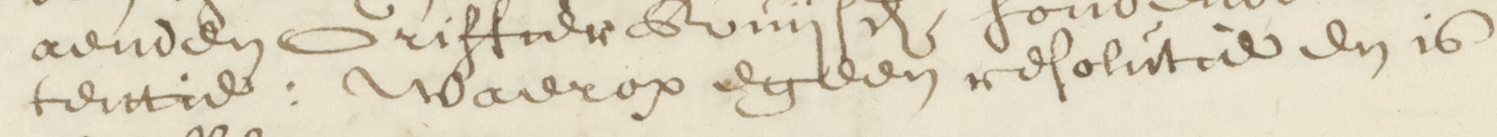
tentie : Waerop egeen resolutie en is
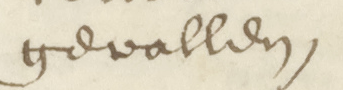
gevallen.
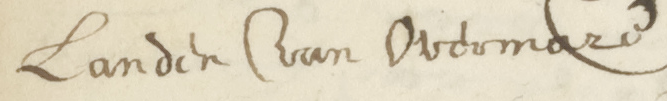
Landen van Overmaze
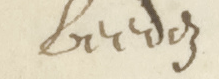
beeden
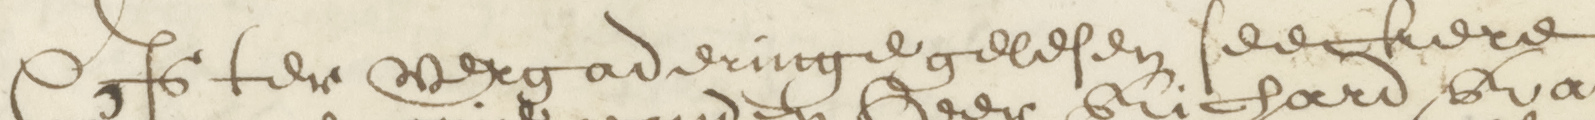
Is ter Vergaderinge gelesen seeckere
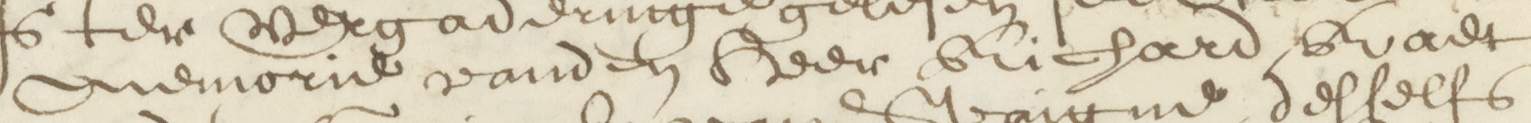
memorie vanden Heer Richard Raet
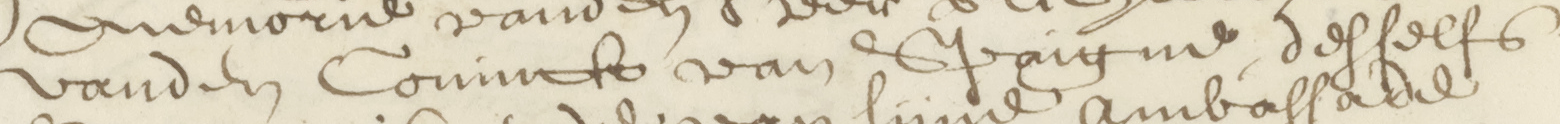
vanden Coninck van Spaigne, desselfs
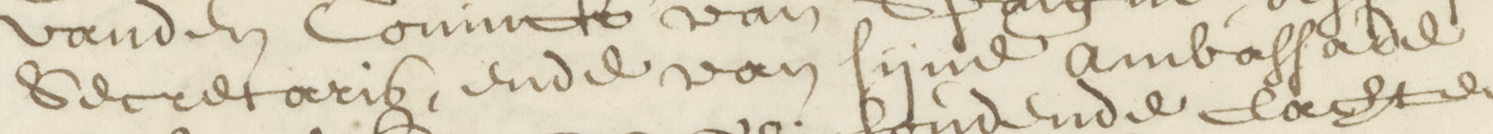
Secretaris, ende van sijne Ambassade
